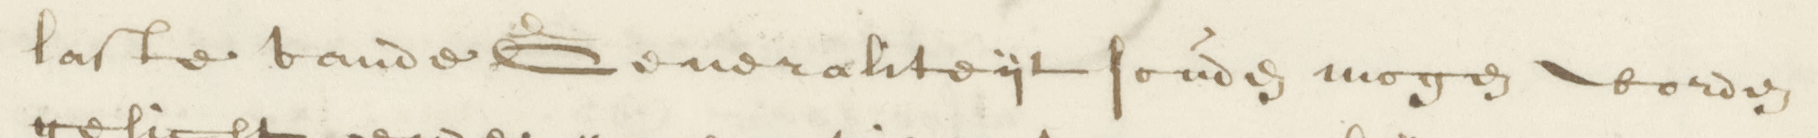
laste vande Generaliteijt souden mogen worden
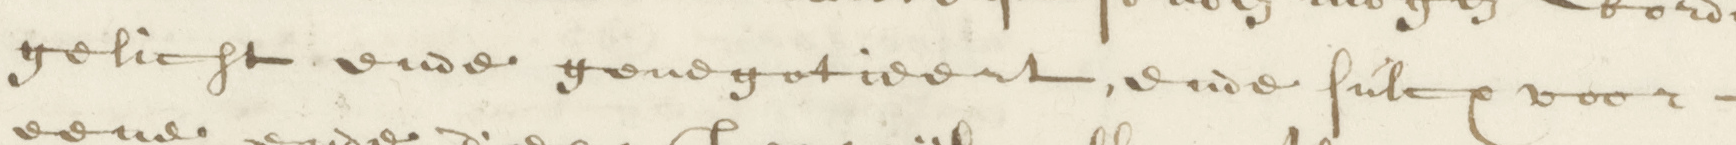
gelicht ende genegotieert, ende sulcx voor
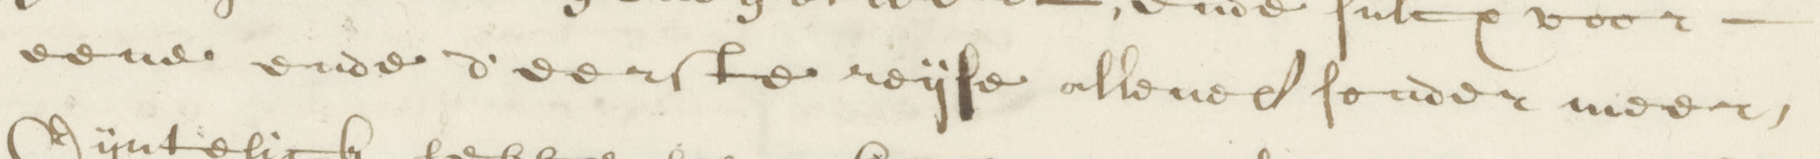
eene ende d‛eerste reijse allenel sonder meer.
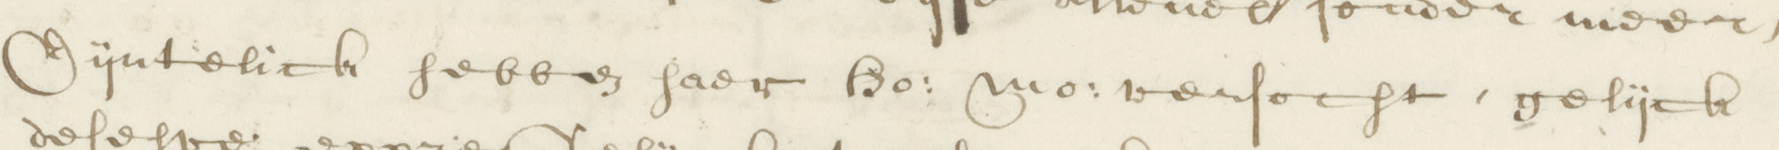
Eijntelick hebben haer Ho:Mo: versocht, gelijck
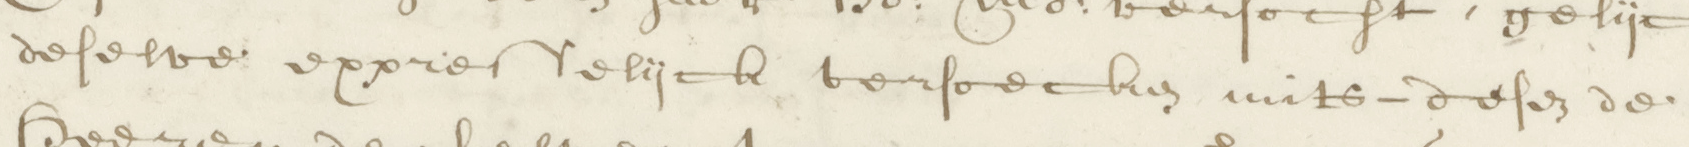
deselve expresselijck versoecken mits-desen de
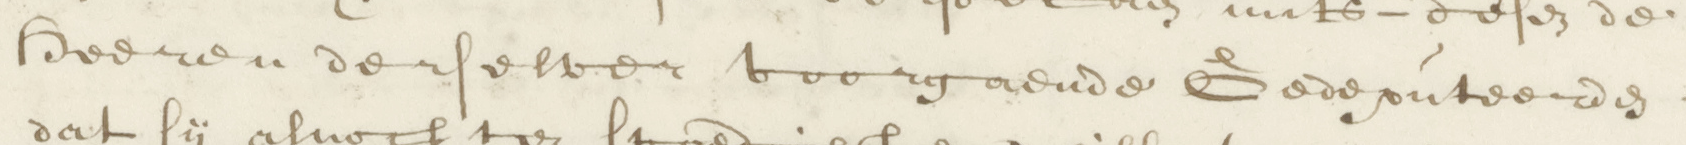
Heeren derselver voorgaende Gedeputeerden
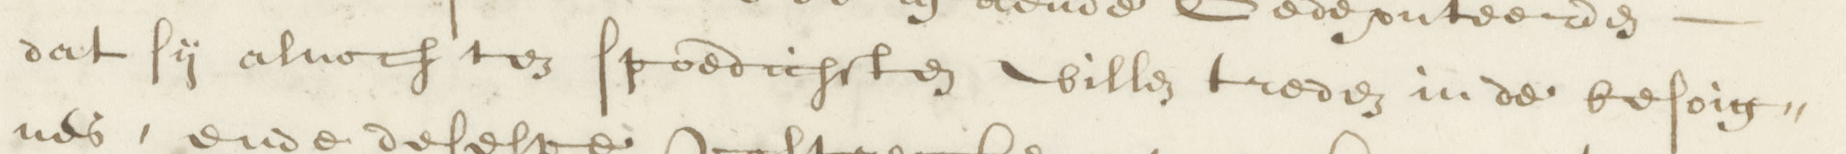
dat sij alnoch ten spoedichsten willen treden in de besoig„
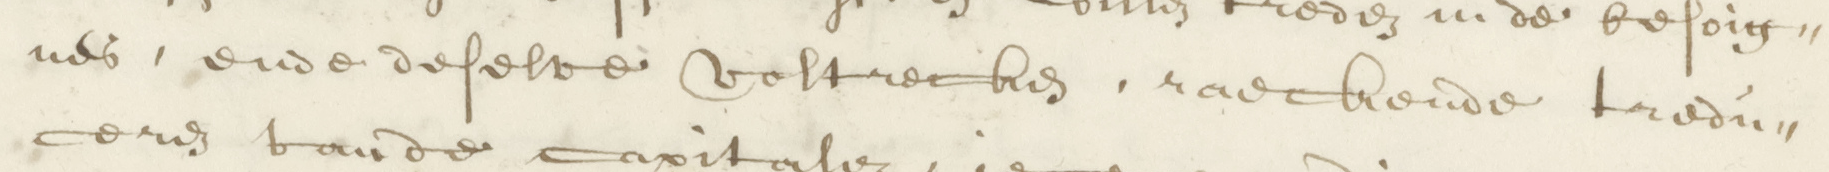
nes, ende deselve voltrecken, raeckende tredu„
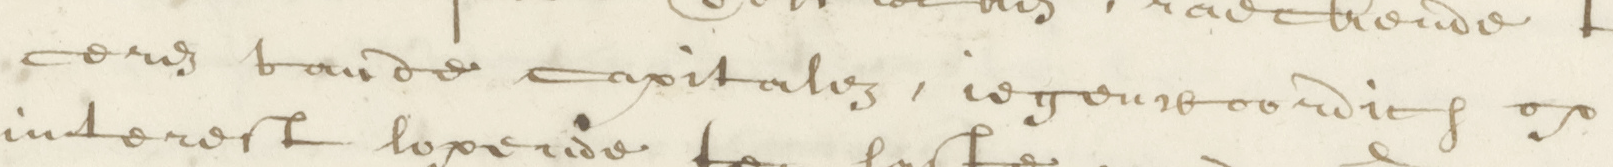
ceren van de capitalen, iegenwoordich op
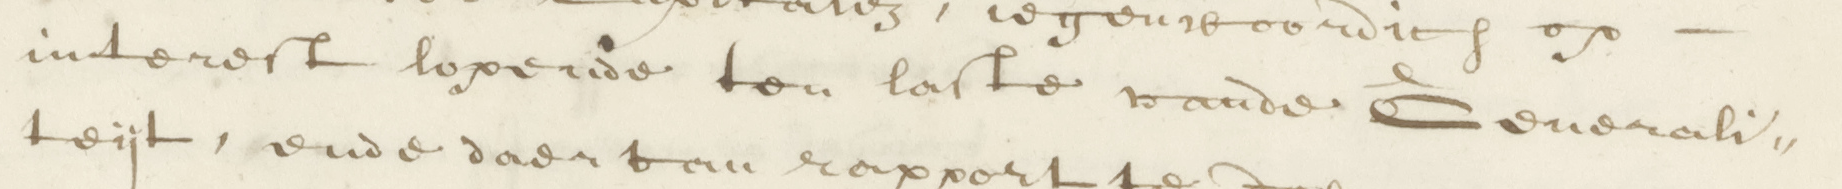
interest lopende ten laste vande Generali„
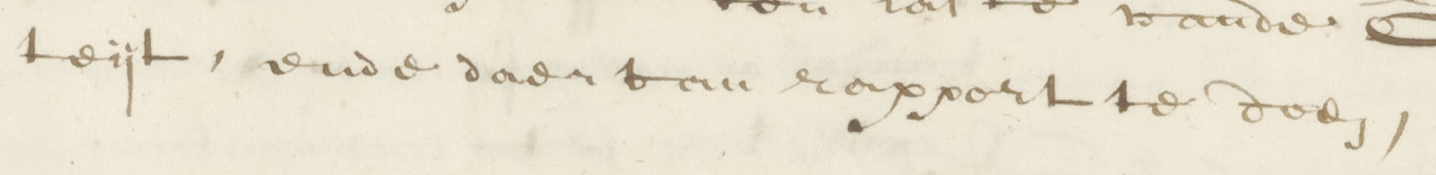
teijt, ende daervan rapport te doen.
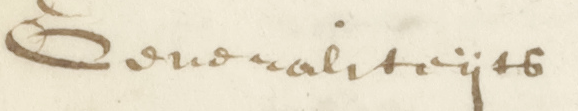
Generaliteijts
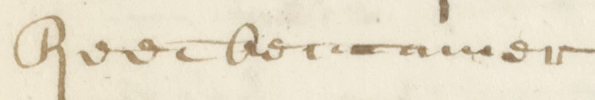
Reeckencamer
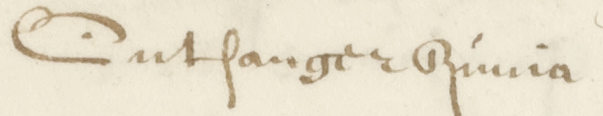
Ontfanger Runia
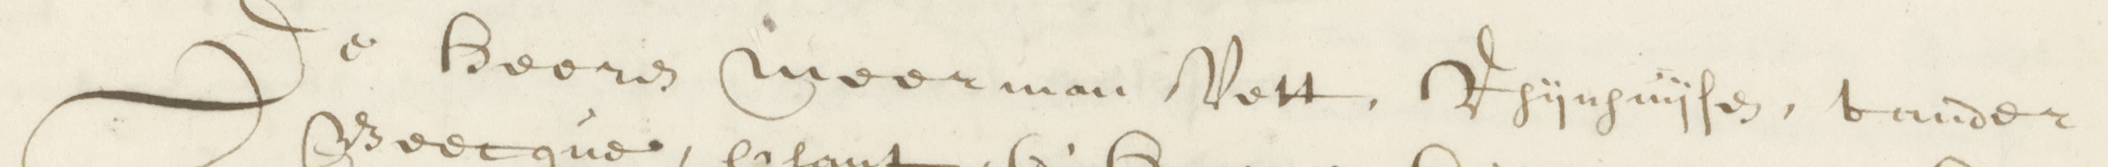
De Heeren Meerman Vett, Rhijnhuijsen, vander
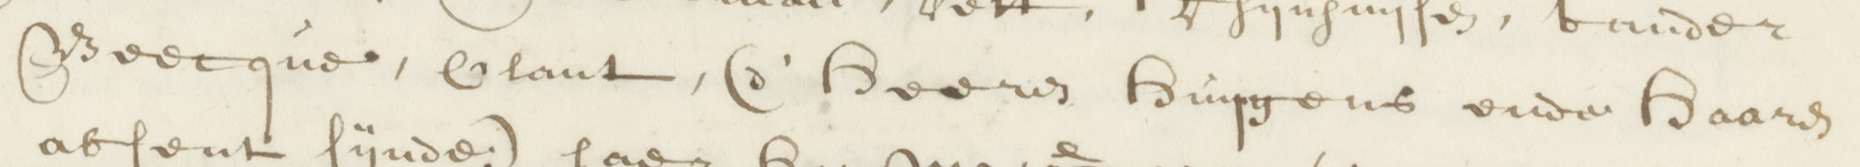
Beecque, Clant, (Heeren Huygens ende Haaren
